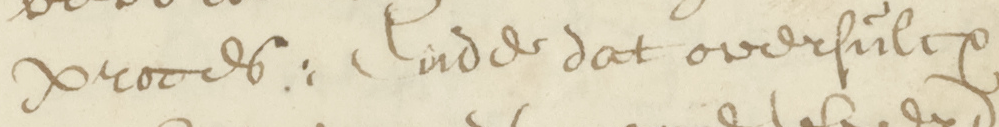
proces; ende dat oversulcx
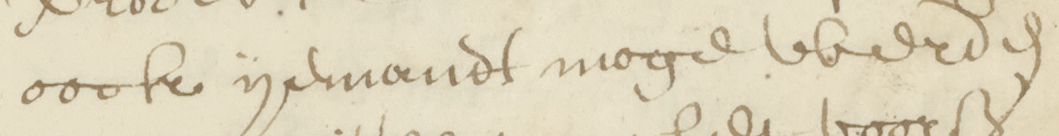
oock ijemandt moge werde
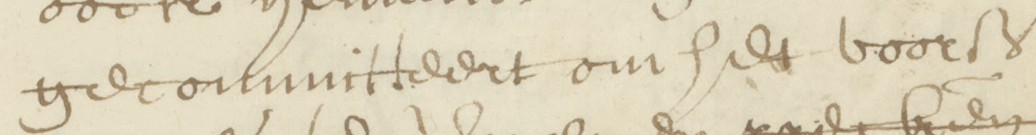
gecommitteert om het voors.
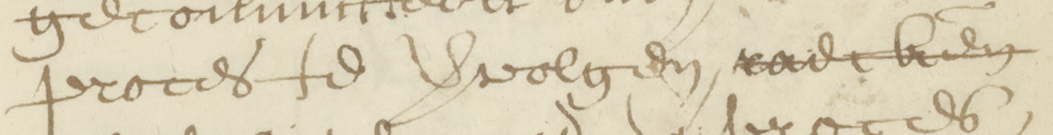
proces te vvolgen, raecken
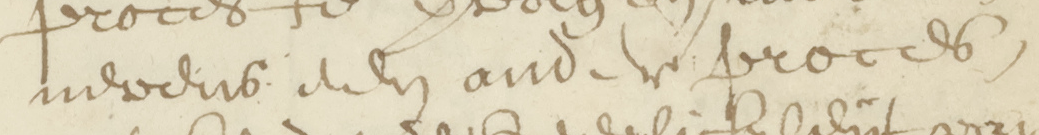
nevens een ander proces,
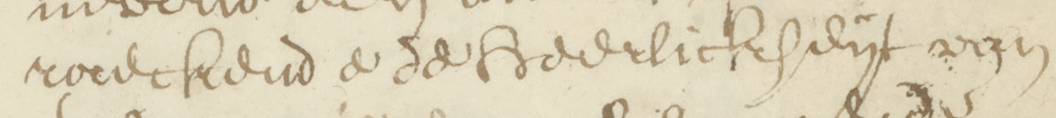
raeckende de Heerlickheijt van
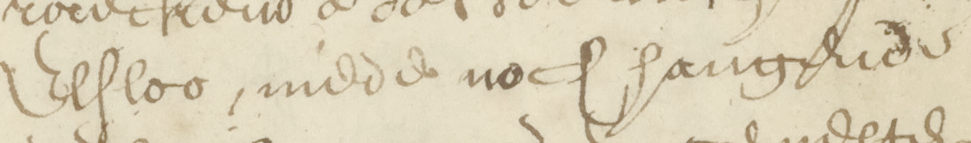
Elsloo, mede noch hangende
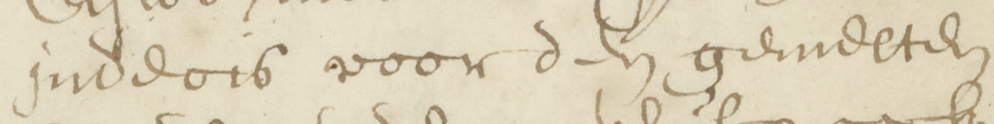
indecis voor den gemelten
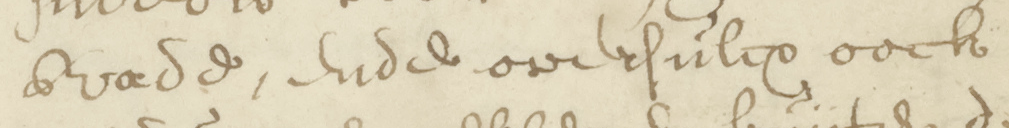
Rade, ende oversulcx oock
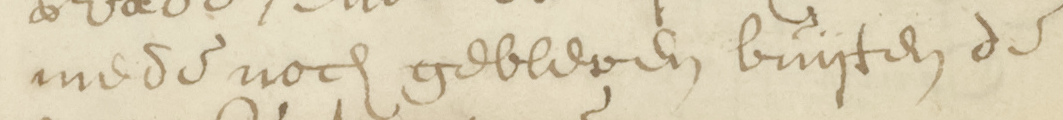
mede noch gebleven buijten de
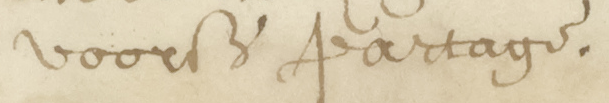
voors partage.
